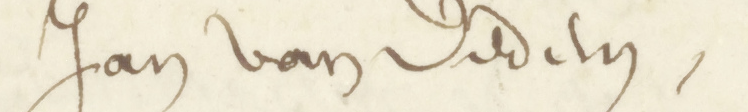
Jan van Deden,
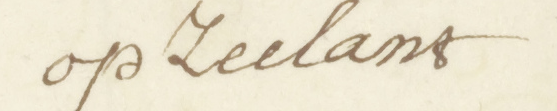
op Zeelant
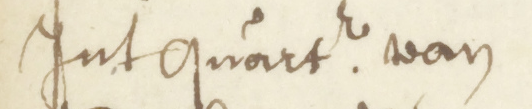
Int quartr. van
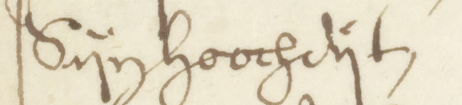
Sijn hoocheijt,
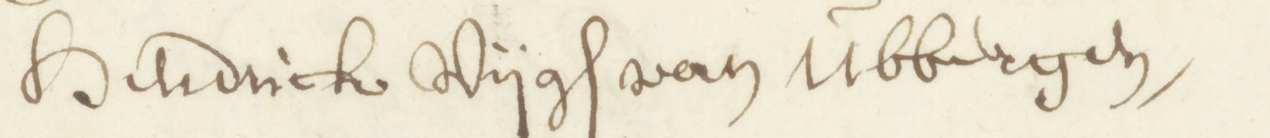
Hendrick Vijgh van Ubbergen,
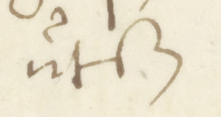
uts
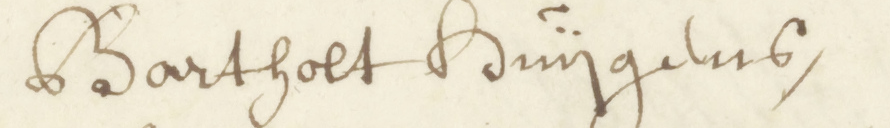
Bartholt Huijgens,
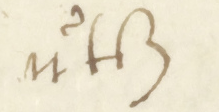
uts
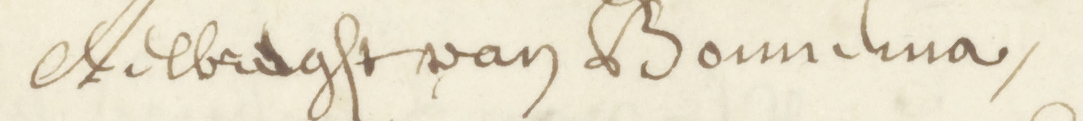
Aelbreght van Bonnema,
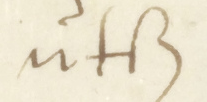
uts
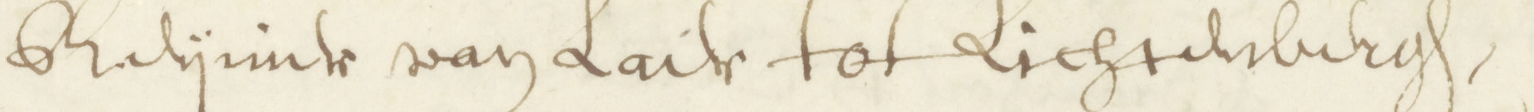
Reijnier van Laer tot Lichtenbergh,
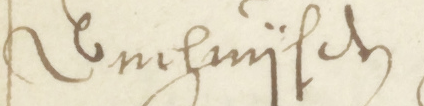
Enchuijsen
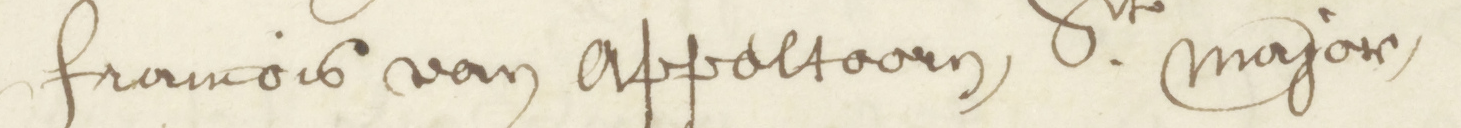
francois van Appeltoorn, St. major,
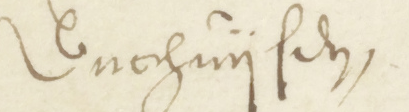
Enchuijsen,
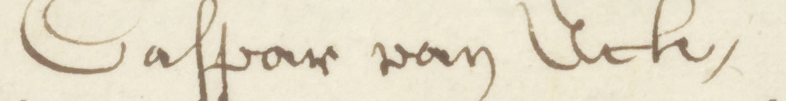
Caspar van Eck,
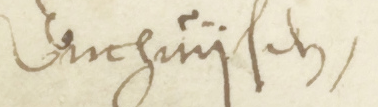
Enchuijsen,
